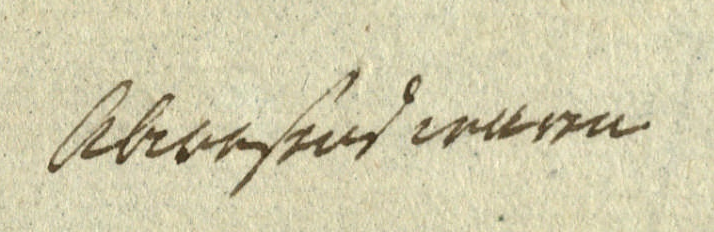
Abwesend waren
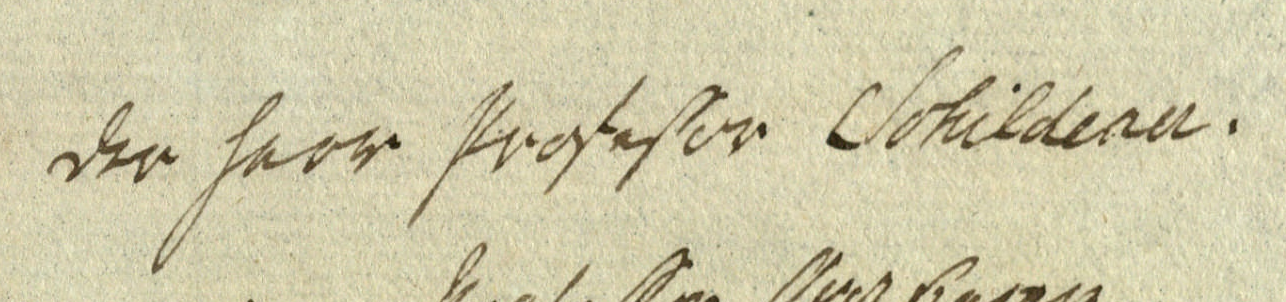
der Herr Professor Schildener.
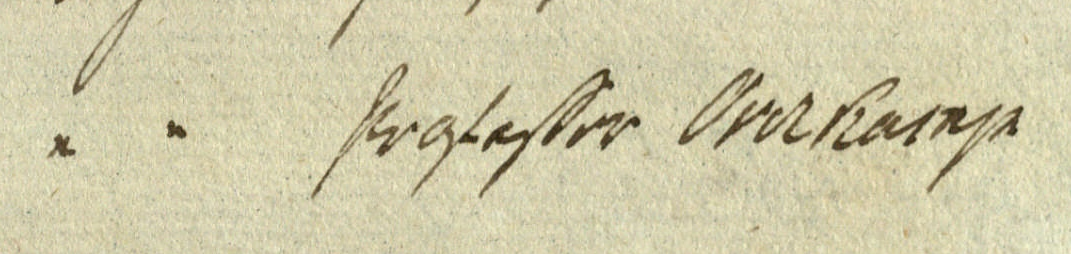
Professor Overkamp.
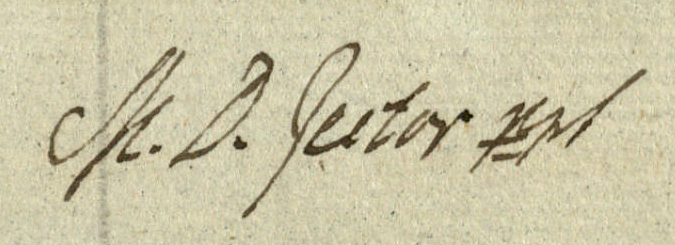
M. D. Rector ppt.
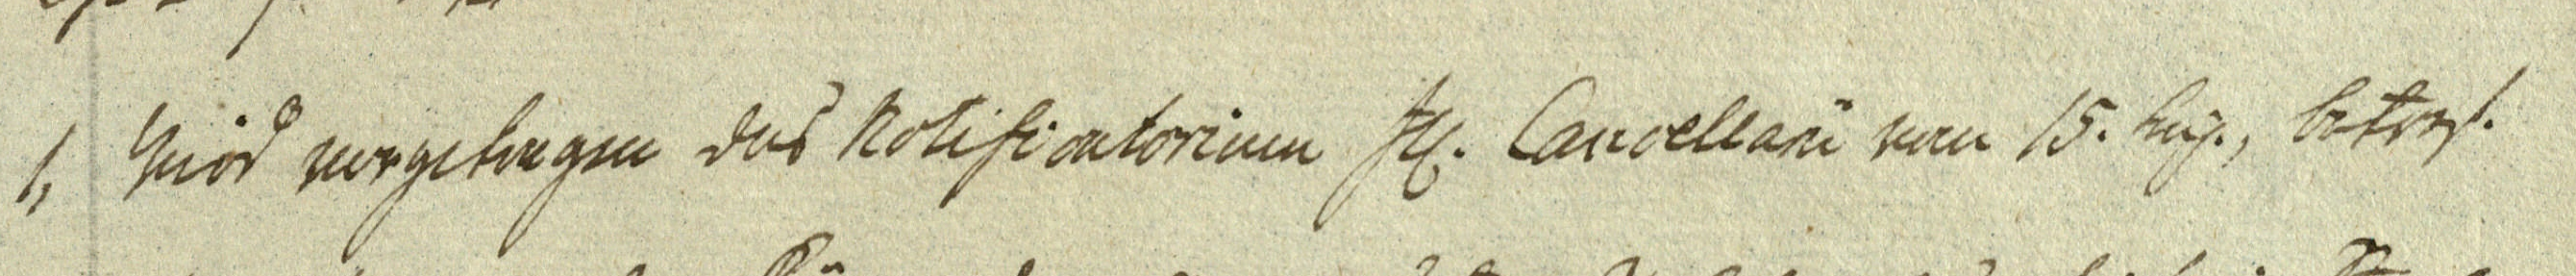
1, Wird vorgetragen das Notificatorium Ill. Cancellari vom 15. huj., betref¬
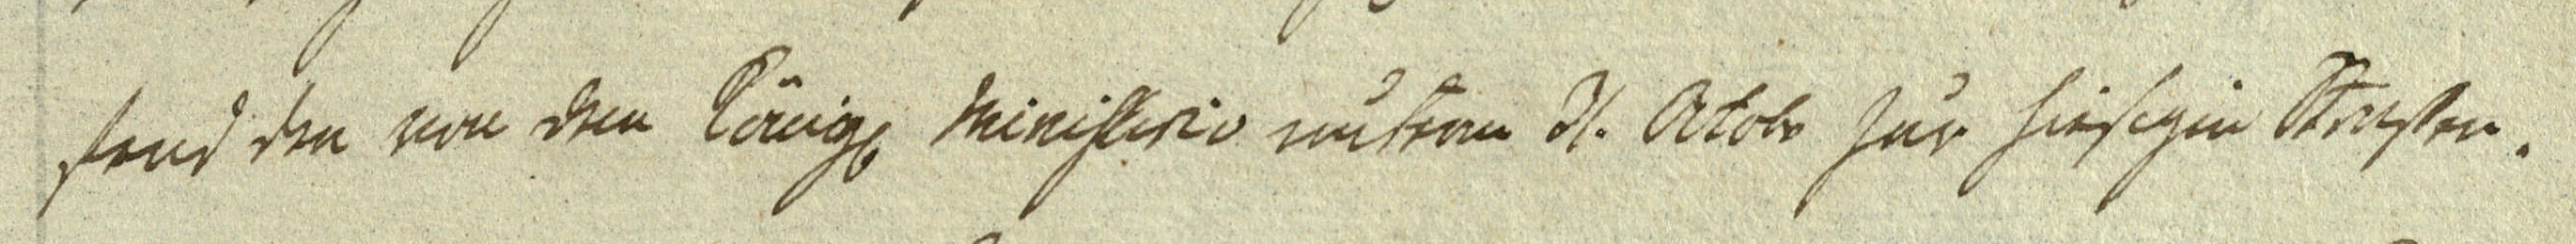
fend den von dem Königl Ministerio unterm 1. Octobr zur hiesigen Strassen¬
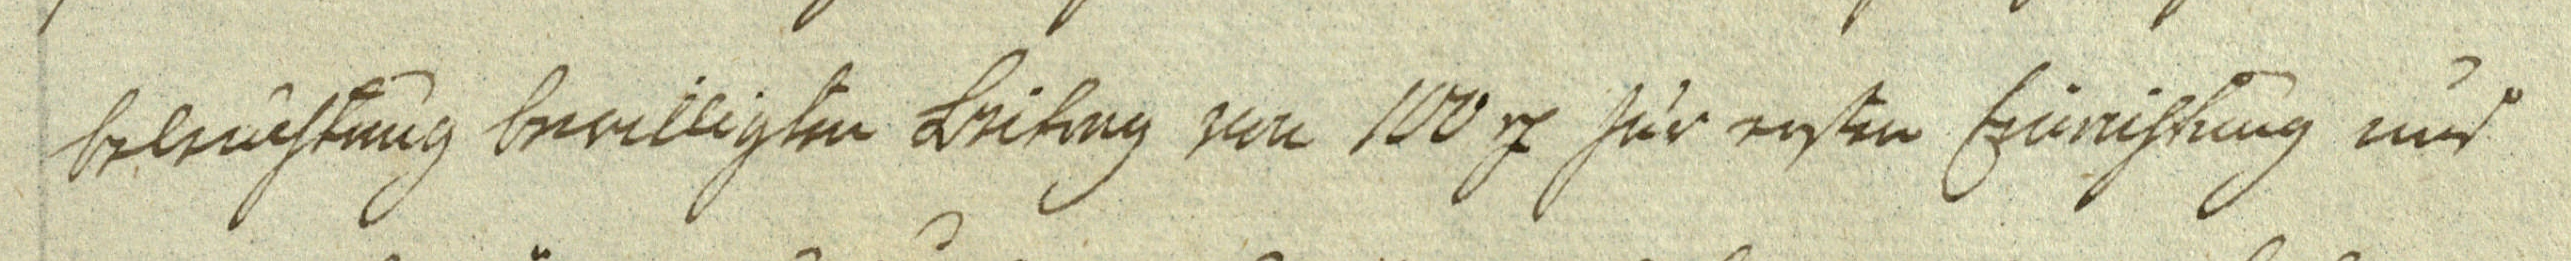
beleuchtung bewilligten Beitrag von 100 rt zur ersten Einrichtung und
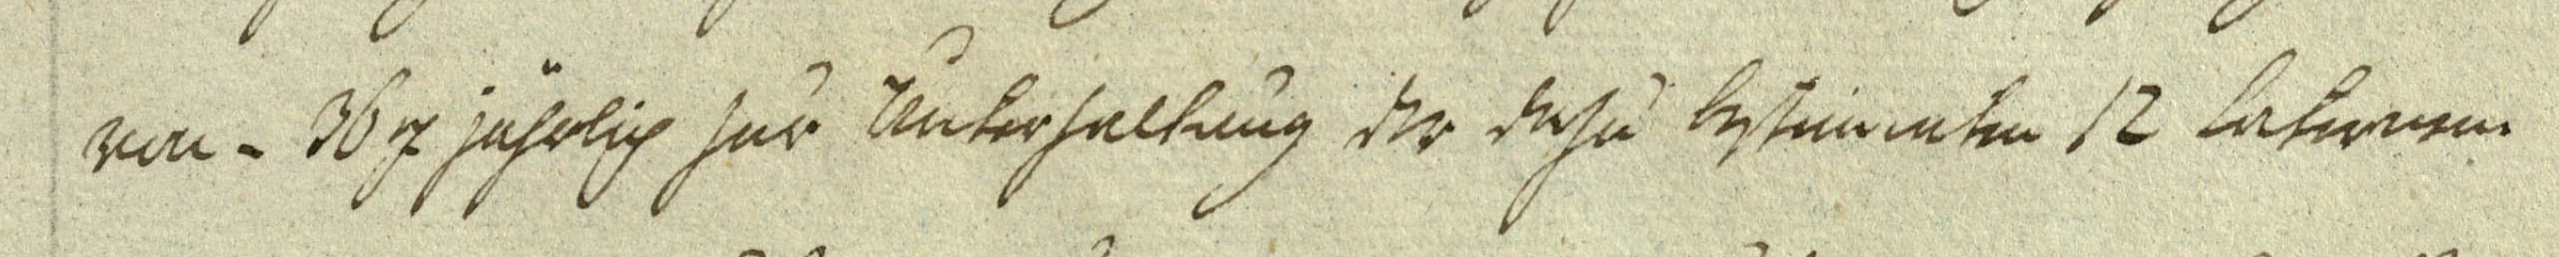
von 36 rt jährlich zur Unterhaltung der dazu bestimmten 12 Laternen.
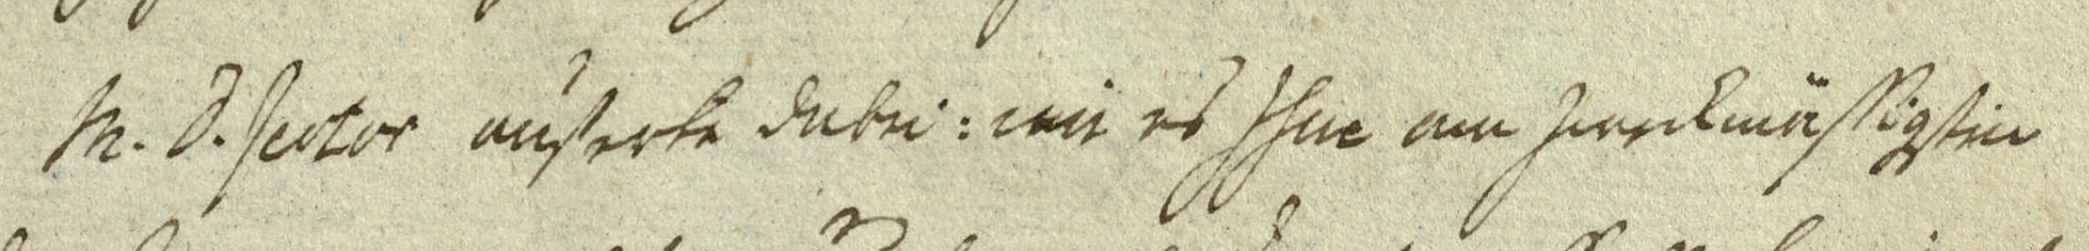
M. D. Rector äußerte dabei: wie es Ihm an zweckmässigsten
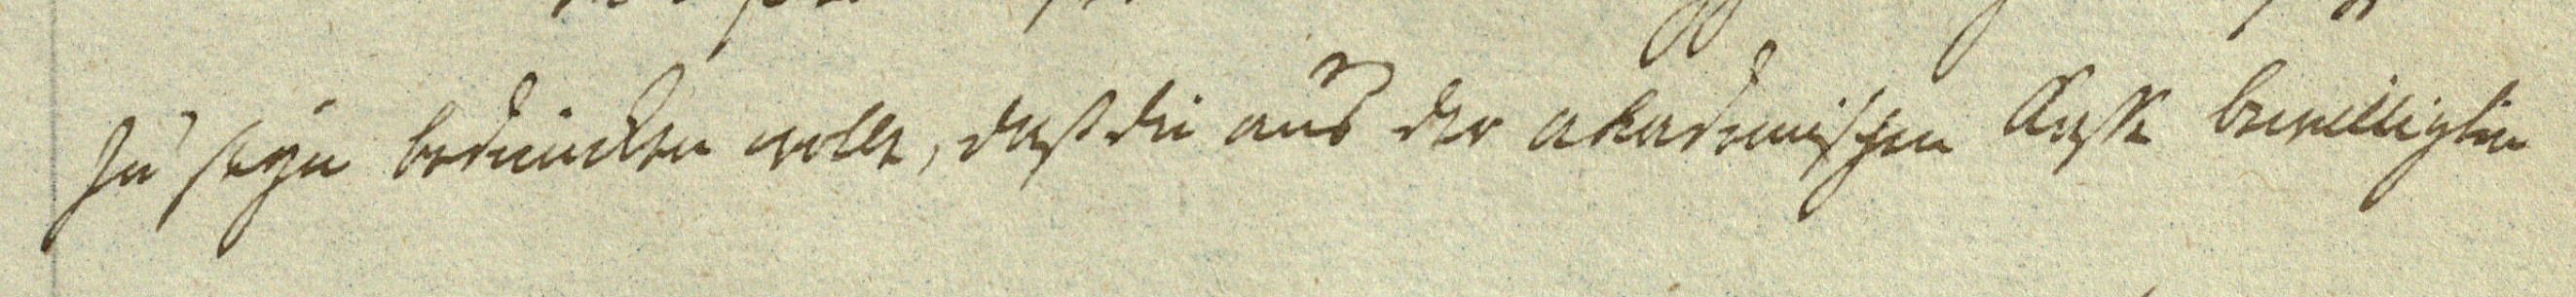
zu seÿn bedüncken wolle, daß die aus der Akademischen Kasse. bewilligten
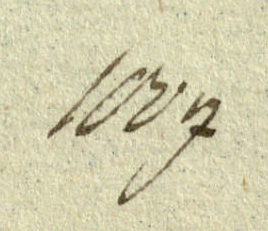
100 rt
